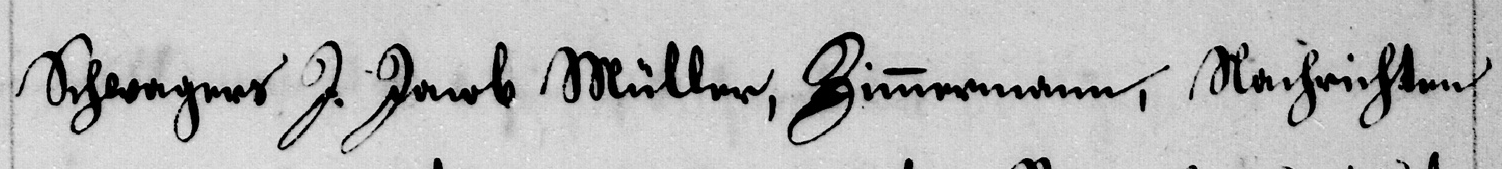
Schwagers J. Jacob Müller, Zimmermann, Nachrichten
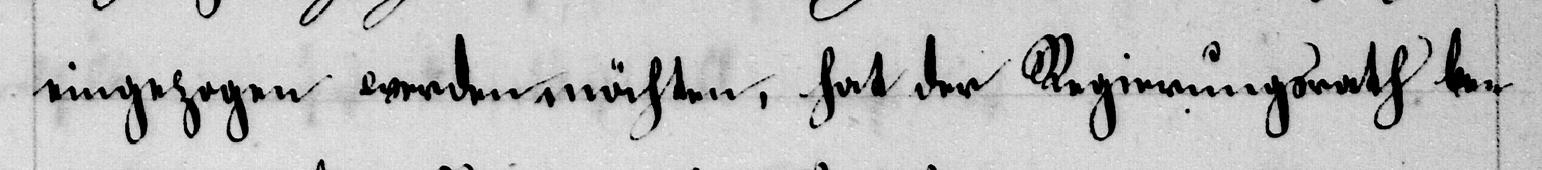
eingezogen werden möchten, hat der Regierungsrath be¬
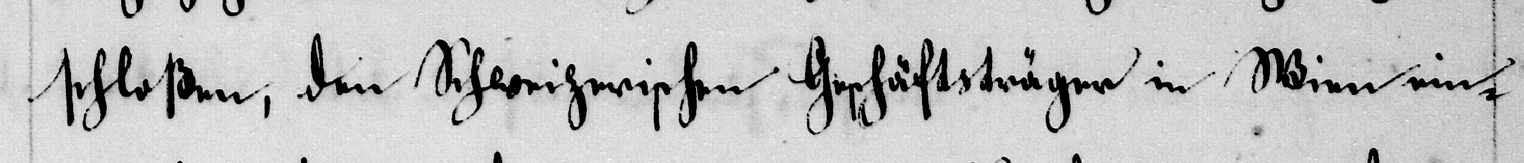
schloßen, den Schweizerischen Geschäftsträger in Wien ein¬
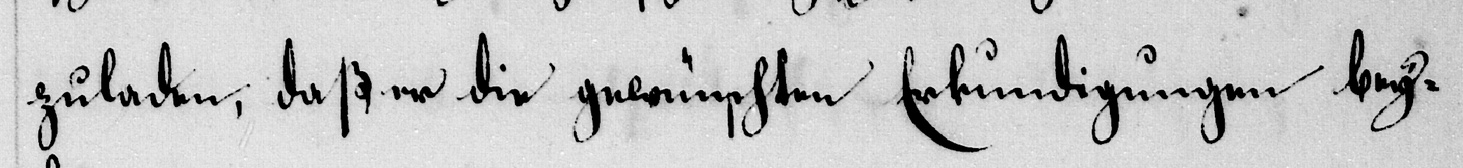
zuladen, daß er die gewünschten Erkundigungen bey¬
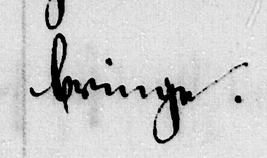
bringe.
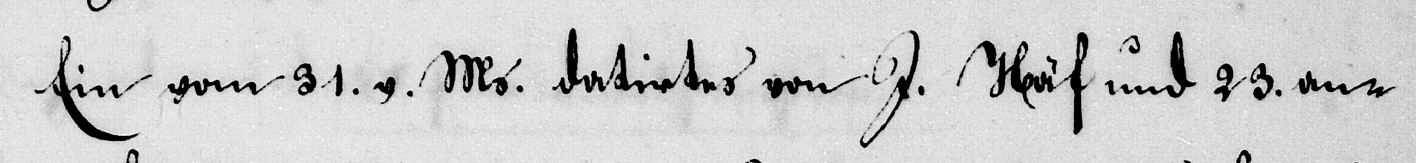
Ein vom 31. v. Ms. datirtes von J. Näf und 23. an¬
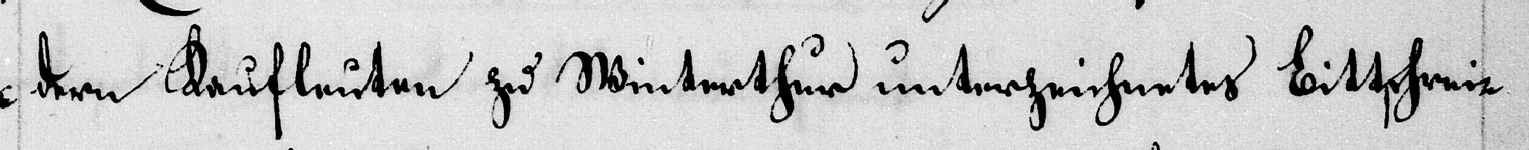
dern Kaufleuten zu Winterthur unterzeichnetes Bittschrei¬
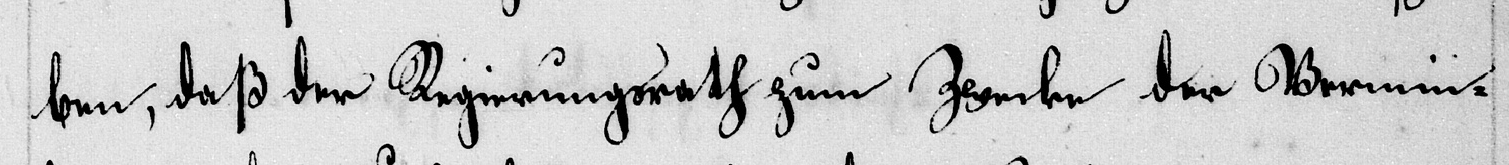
ben, daß der Regierungsrath zum Zwecke der Verein¬
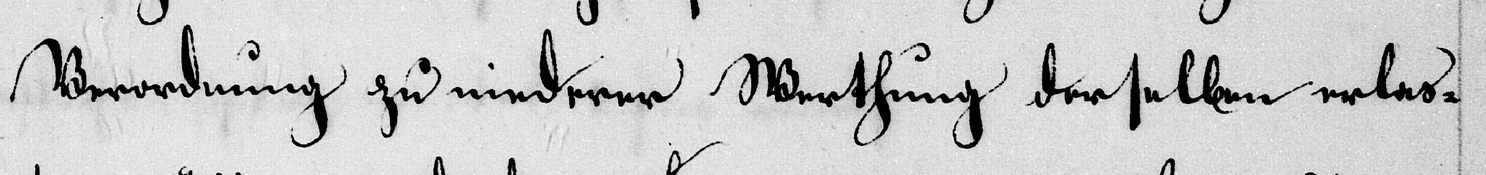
Verordnung zu niederer Werthung derselben erlaß¬
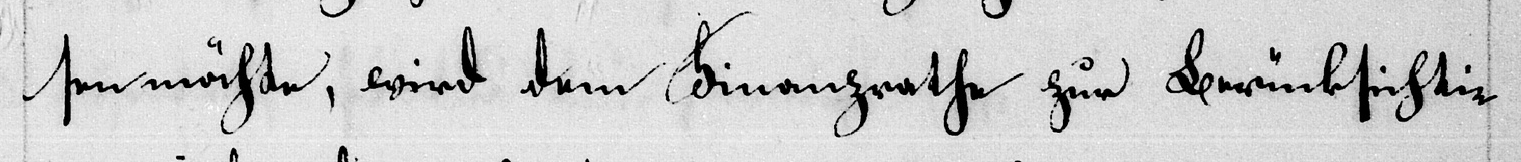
en möchte, wird dem Finanzrathe zur Berücksichti¬
